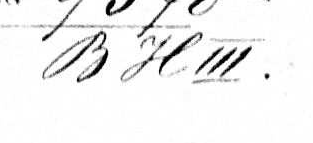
BH III
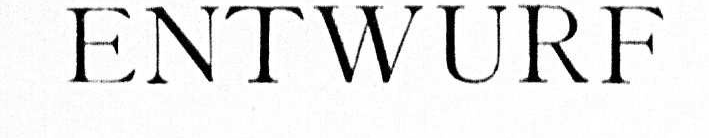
Entwurf
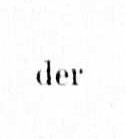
der
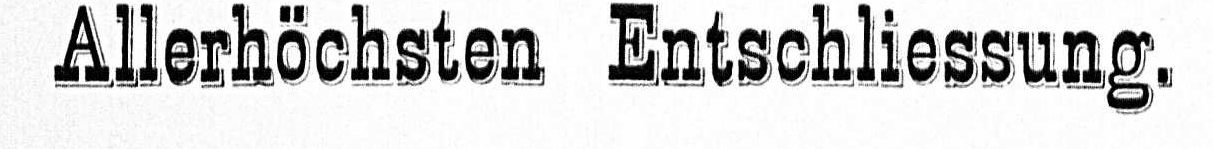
Allerhöchsten Entschliessung
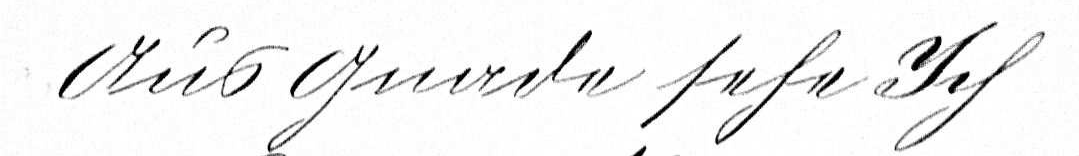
Aus Gnade sehe Ich
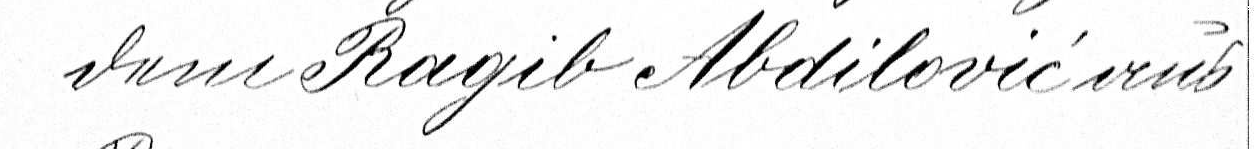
dem Ragib Abdilović aus
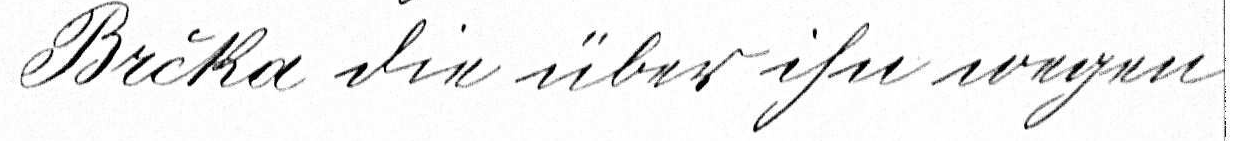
Brčka die über ihn wegen
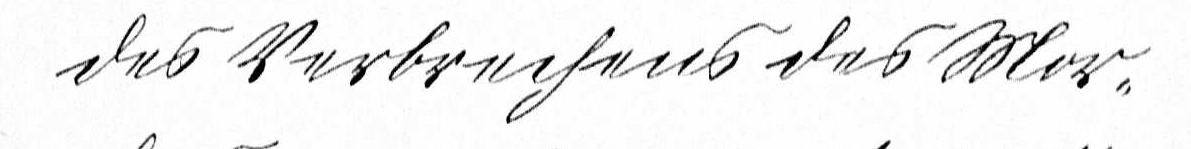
des Verbrechens des Mor¬
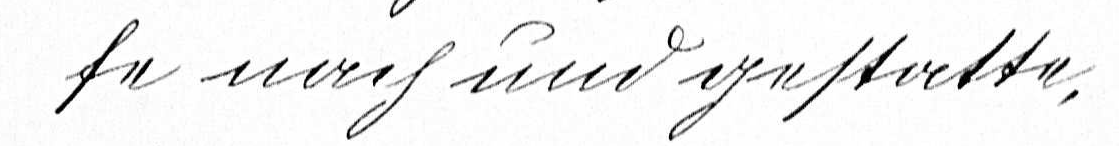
fe nach und gestatte,
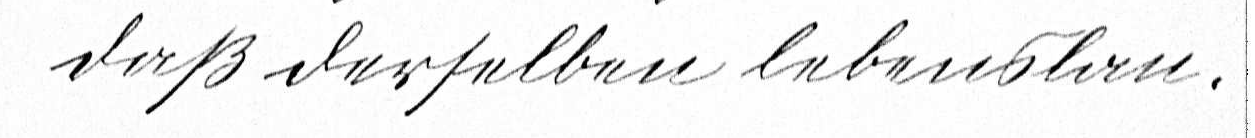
daß derselben lebenslan¬
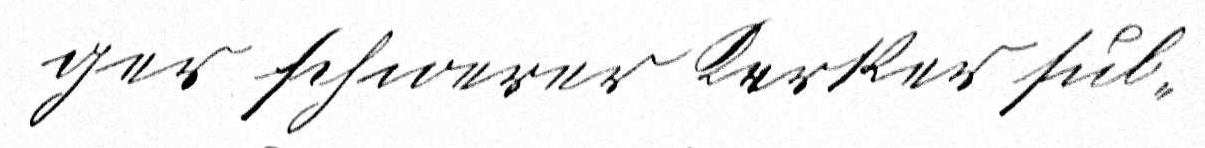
ger schwerer Kerker sub¬
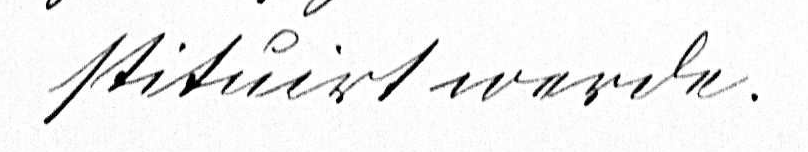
stituirt werde.
